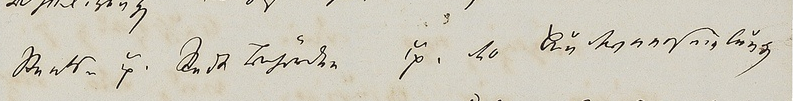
Staats- &. Stadt Behörden &. der Bundesversammlung
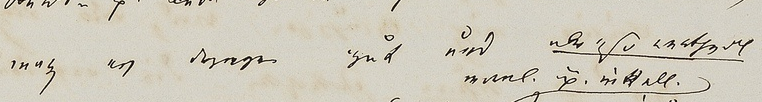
mag es dagegen gut und eben so werthvoll
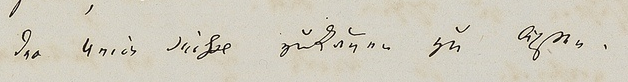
der Union Suisse zukommen zu lassen.
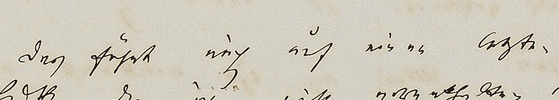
Das führt mich auf einen letzten
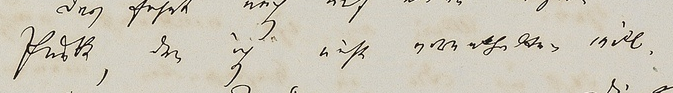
Punkt, den ich nicht vorenthalten will.
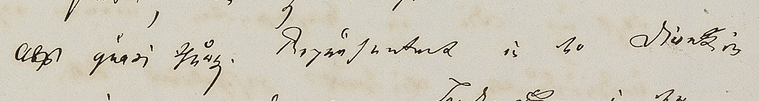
Als quasi thurg. Repräsentant in der Direktion
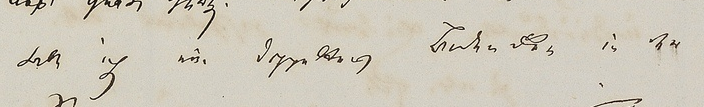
habe ich ein doppeltes Bedenken in der
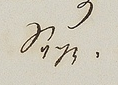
Sache.
